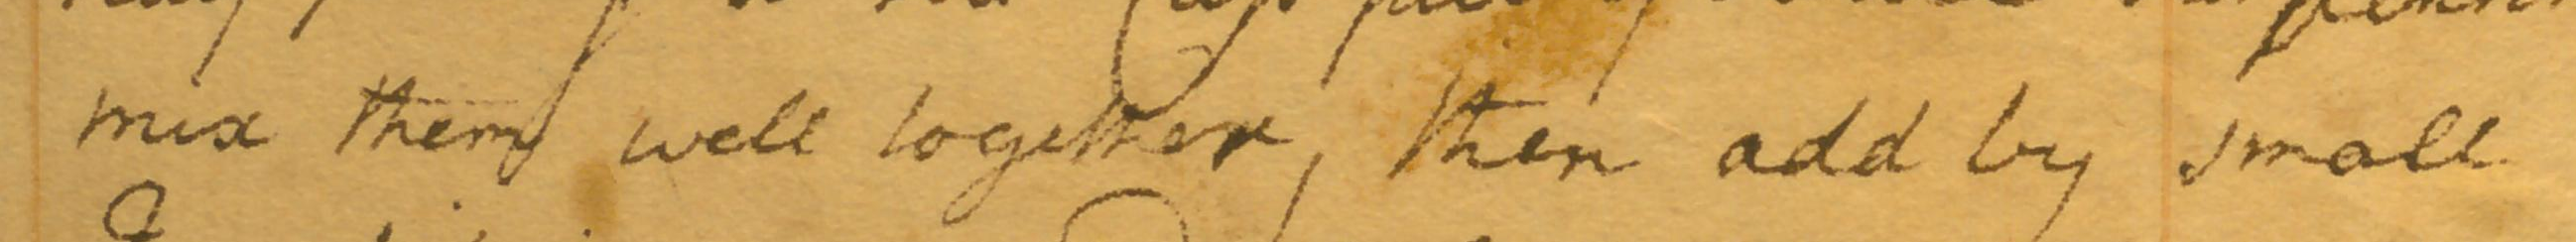mix them well together, then add by small
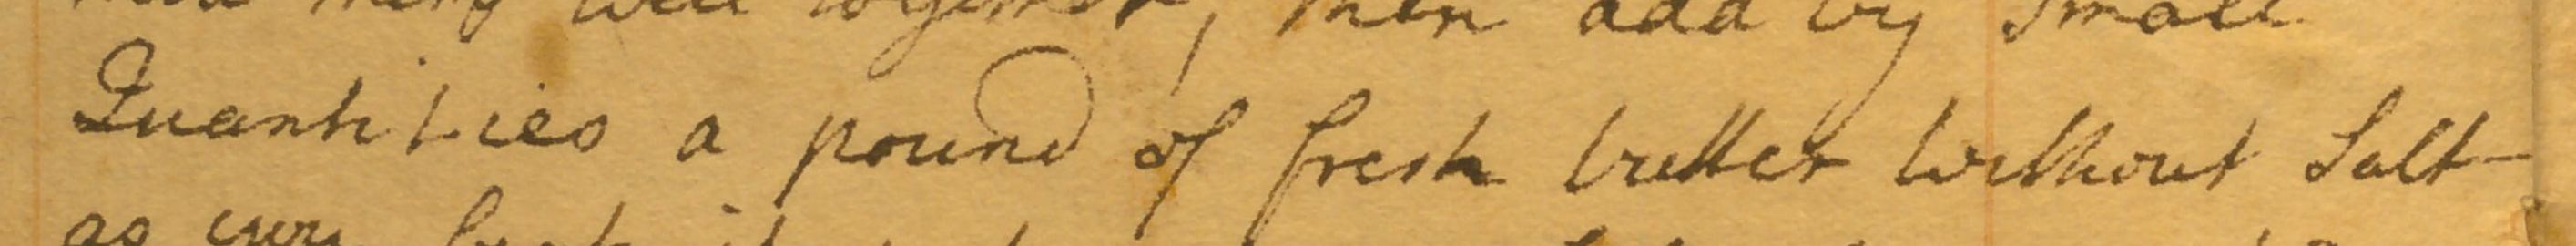Quantities a pound of fresh butter without salt
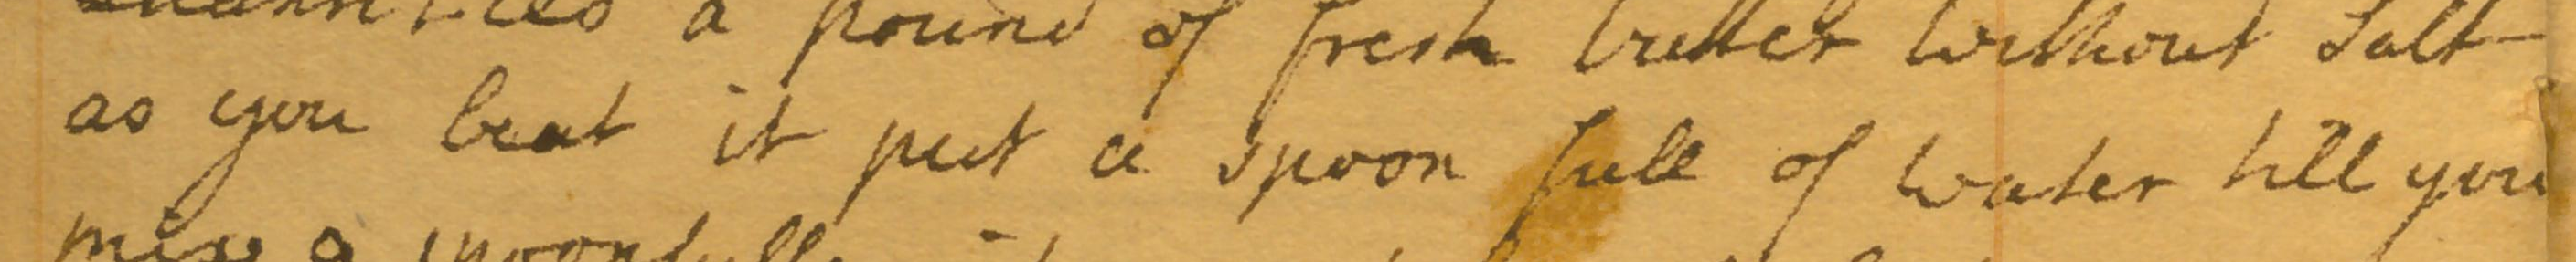as you beat it put a spoon full of water till you
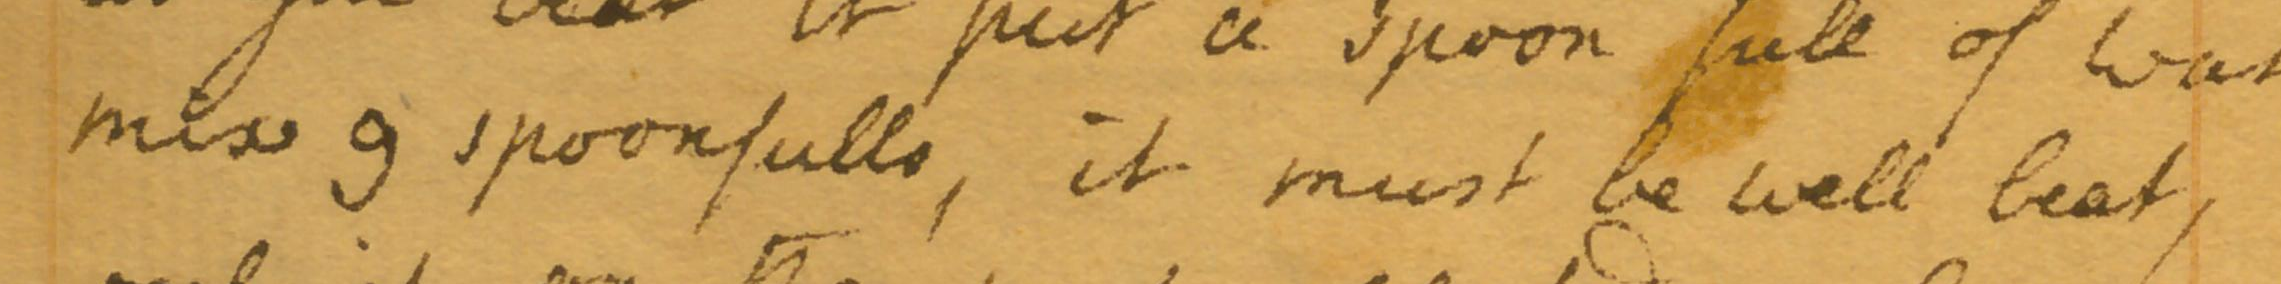mix 9 spoonfulls, it must be well beat,
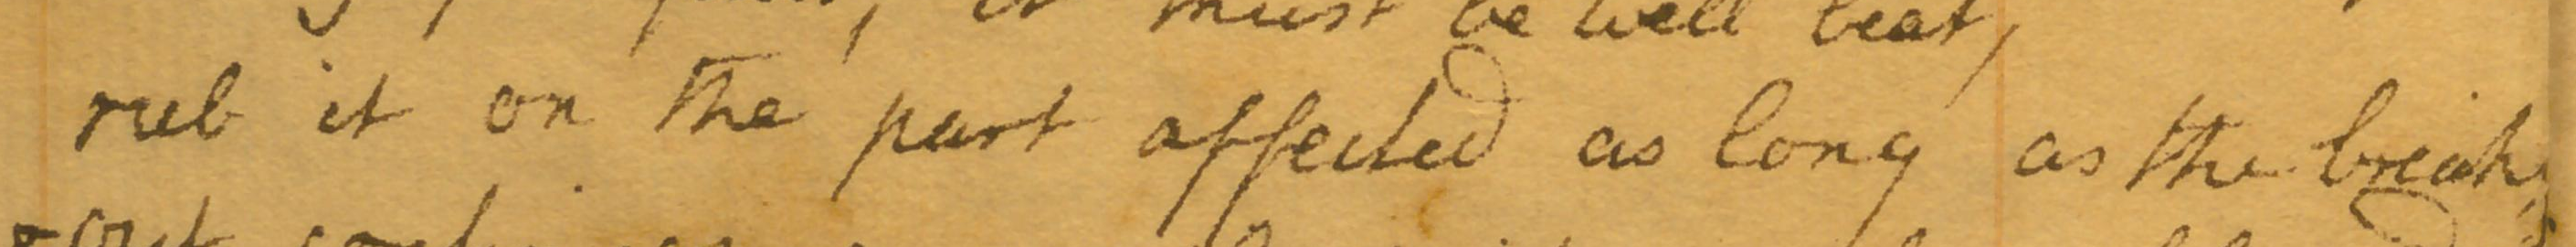rub it on the part affected as long as the break
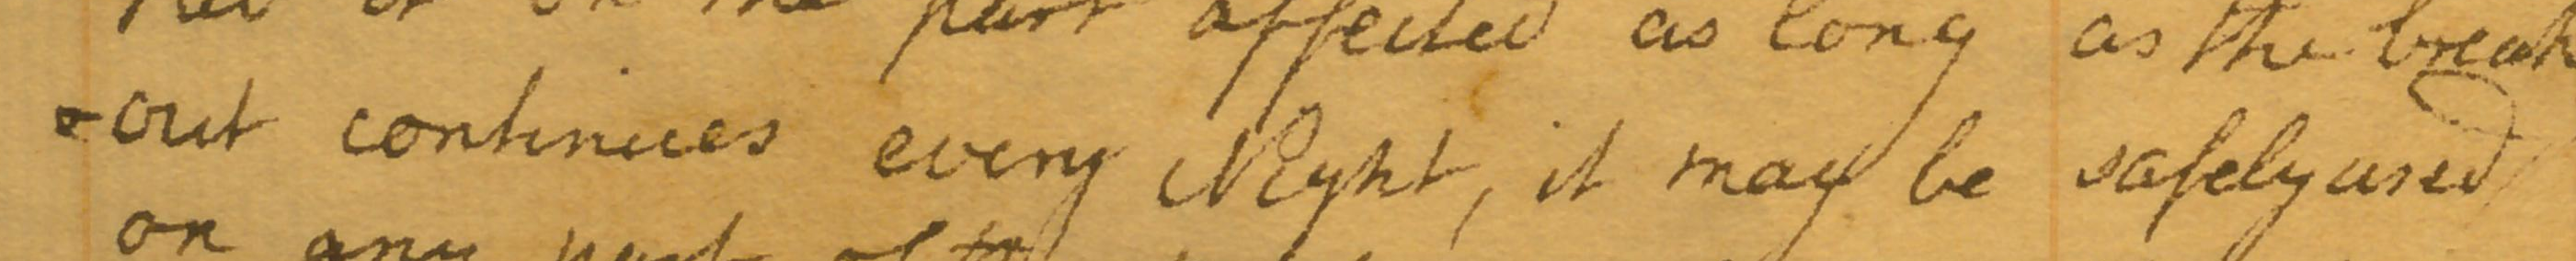-out continues every Night, it may be safely used
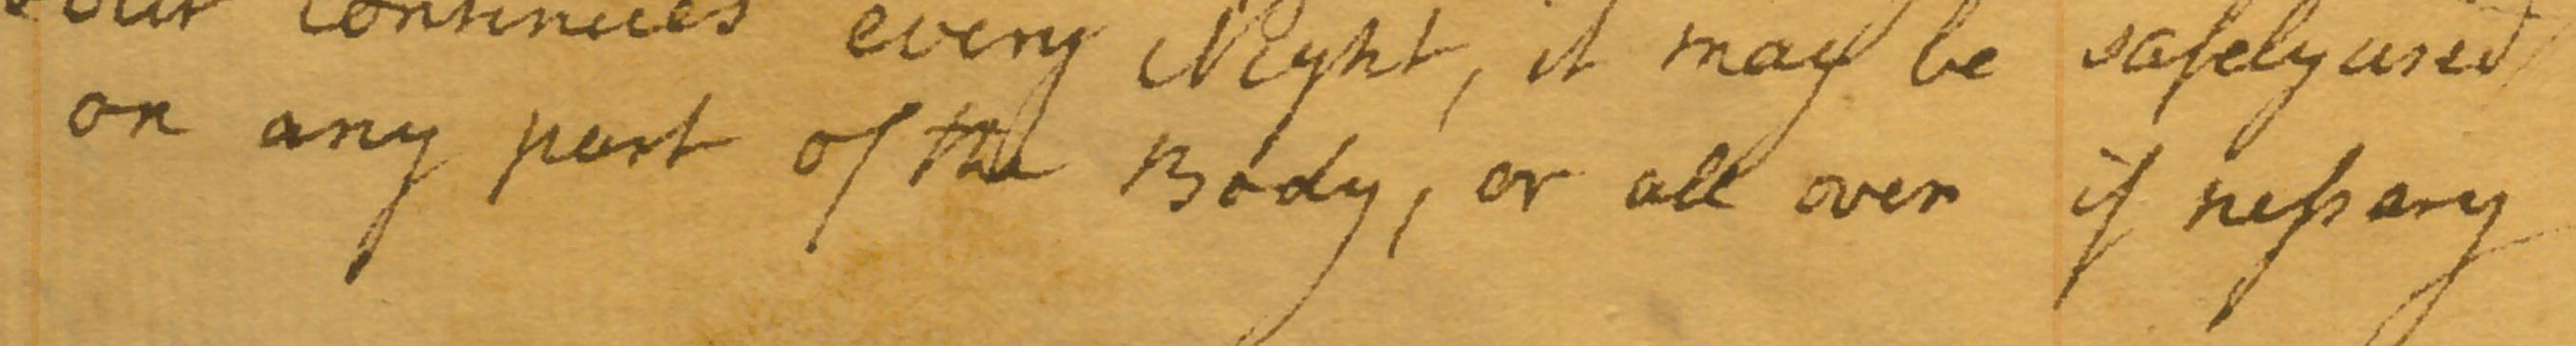on any part of the Body, or all over if nessary
